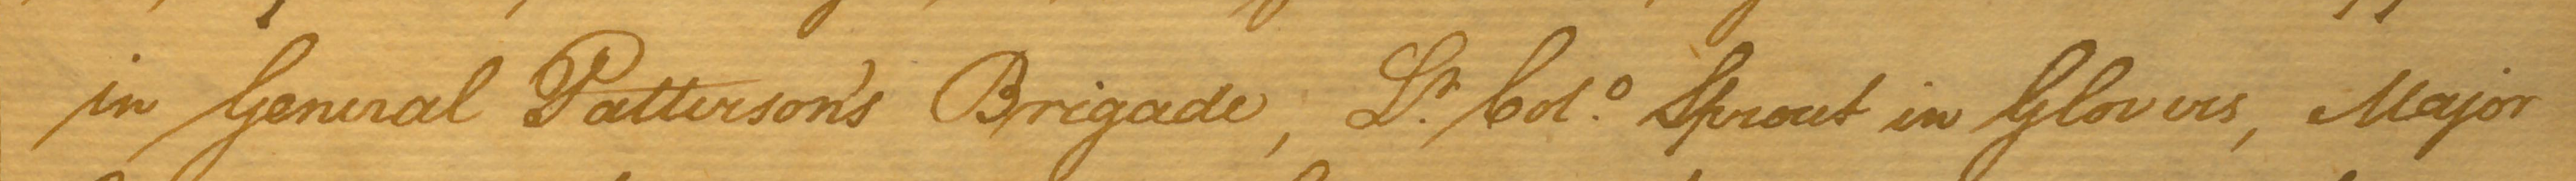in General Patterson's Brigade, L^t. Col^o. Sprout in Glovers, Major
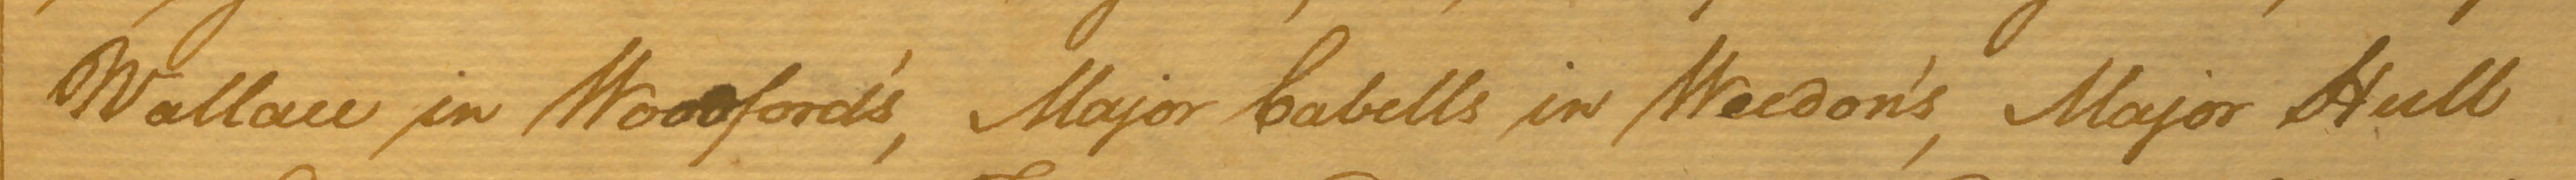Wallace in Woodford's, Major Cabells in Weedon's, Major Hull
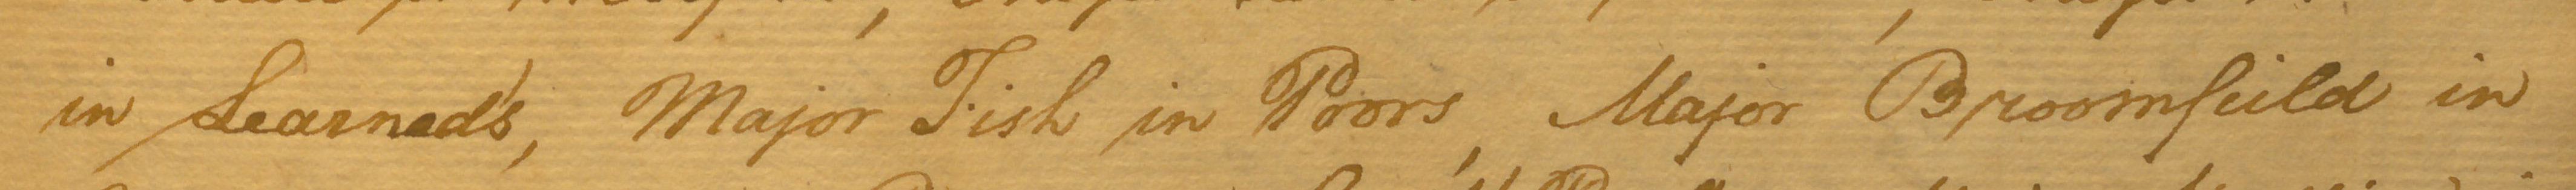in Learned's, Major Fish in Poors, Major Broomfield in
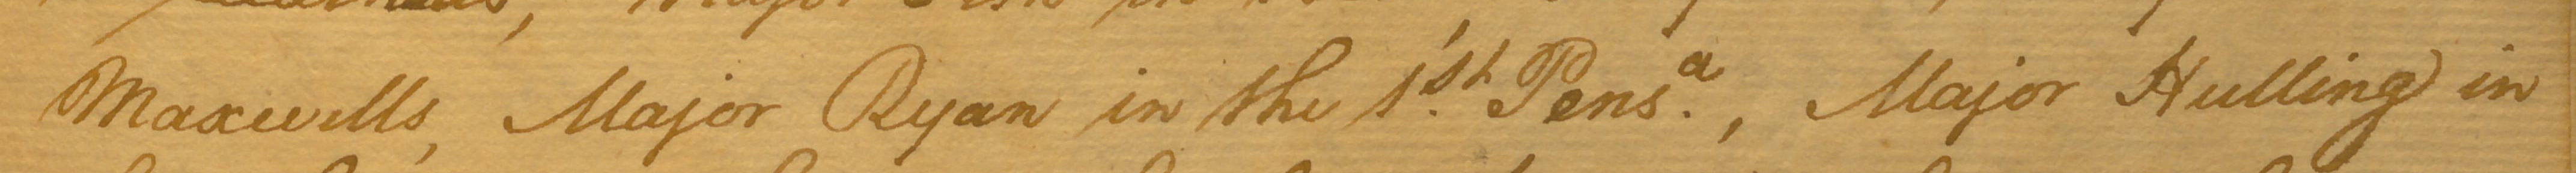Maxwells, Major Ryan in the 1^st. Pens^a., Major Hulling in
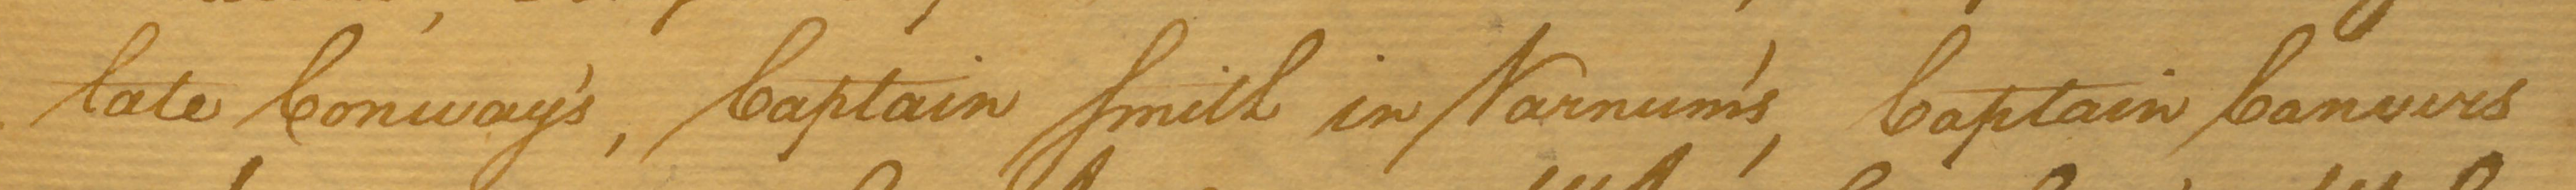late Conway's, Captain Smith in Varnum's, Captain Canvers
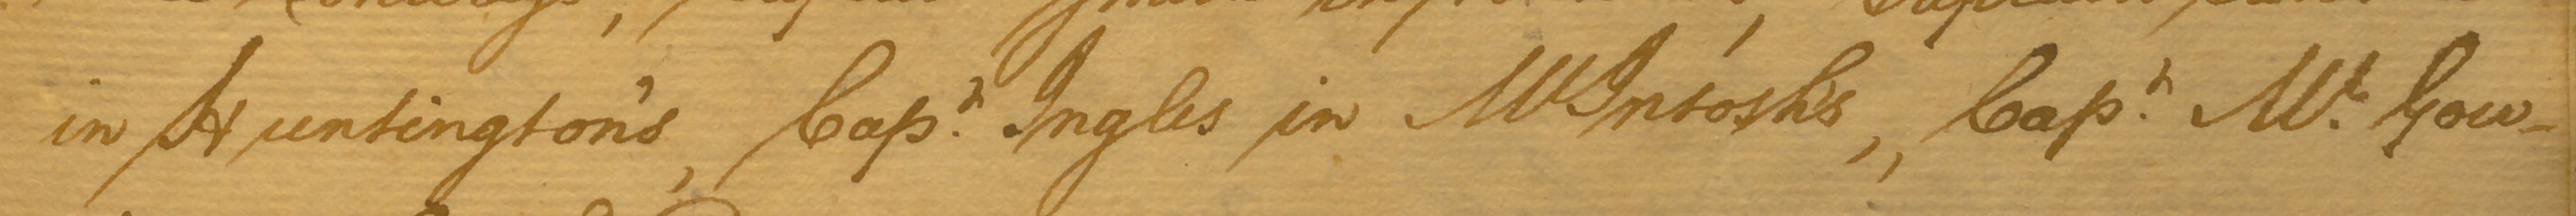in Huntington's, Cap^t. Ingles in M^cIntosh's, Cap^t. M^c.Gow-
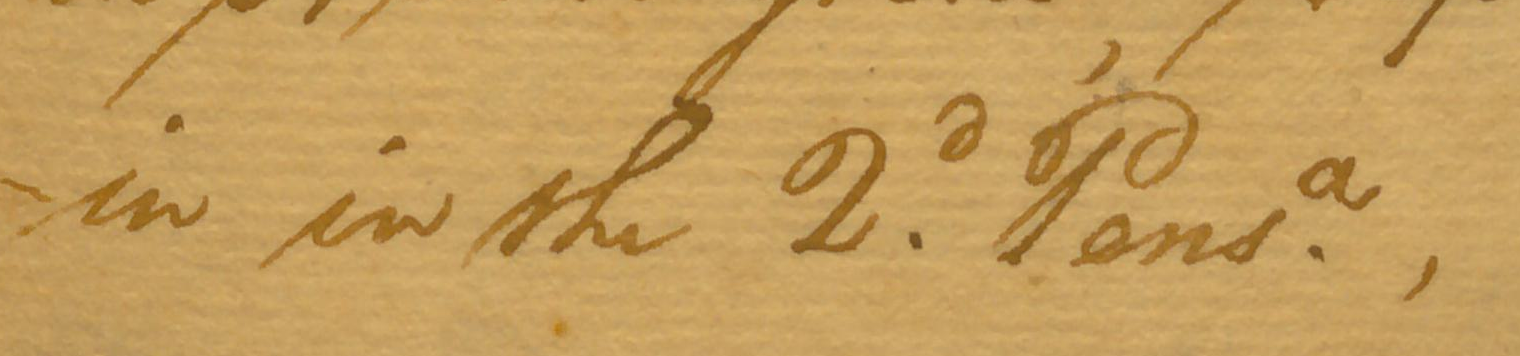-in in the 2^d. Pens^a.,
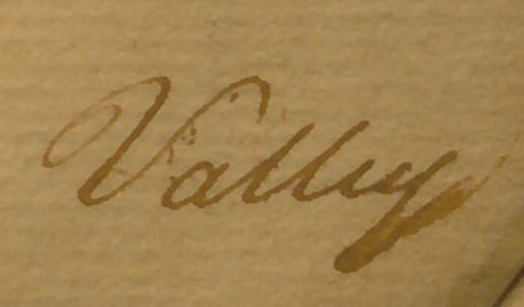Valley
